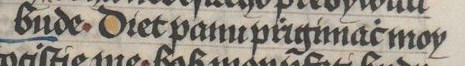bude.Diet panu pṙigimaċ moy
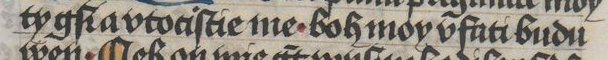ty gſi a utociẛtie me.boh moy vfati budu
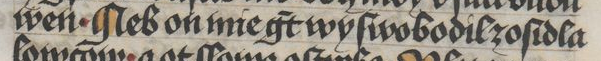wen.Neb on mie ḡt wyſwobodil zoſidla
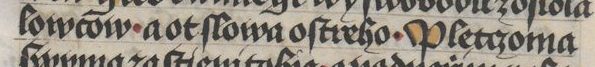lowcow.a ot ſlowa oſtreho.Pletczoma
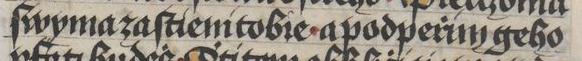ſwyma zaſtiem tobie.a podpeṙím geho
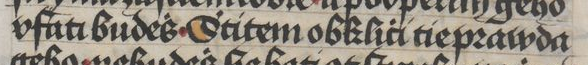vſati budeṡ.Ṡtitem obkliċí tie prawda
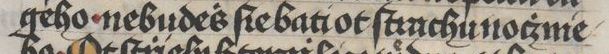geho.nebudeṡ ſie bati ot ſtrachu nocżnie¬
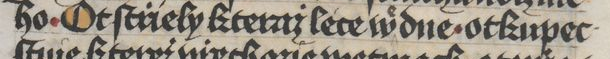ho.Ot ſtṙiely kteraż lece we dne.otkupec¬
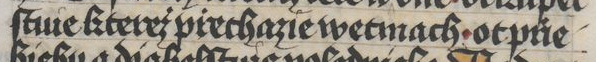ſtuie ktereż pṙechazie wetmach.ot pṙie¬
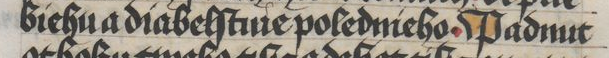biehu a diabelſtuie poledníeho.Padnut
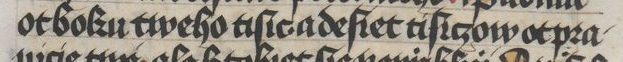ot boku tweho tiſic.a deſiet tiſiczow ot pra¬
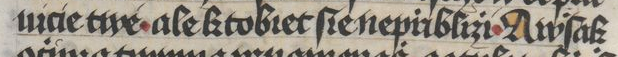uicie twé.ale ktobiet ſie nepṙibliżi.Awẛak
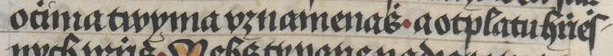oċima twyma uznamenaṡ.a otplatu hṙieẛ¬
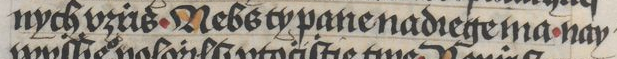nych uzṙiṡ.Nebs ty pane nadiege ma.nay¬
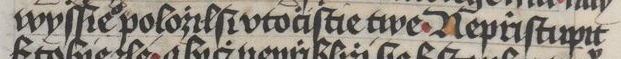wyẛẛie polożilſi utoċiẛtie twe.Nepṙiſtupit
